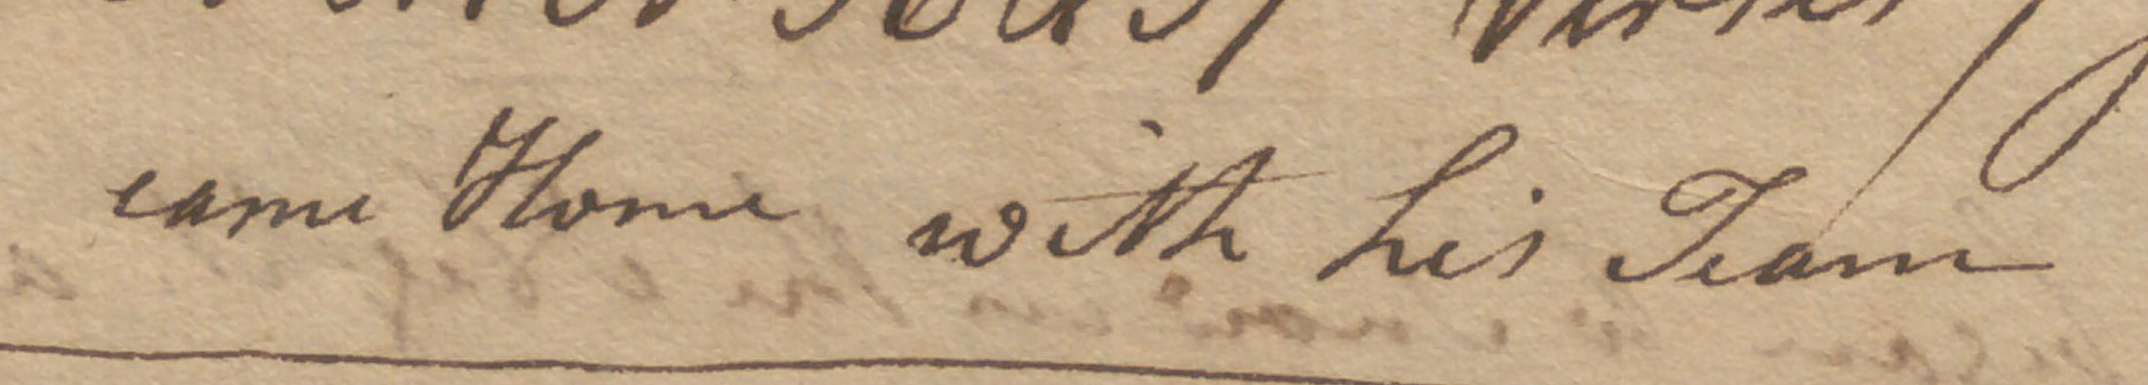came Home with his Team
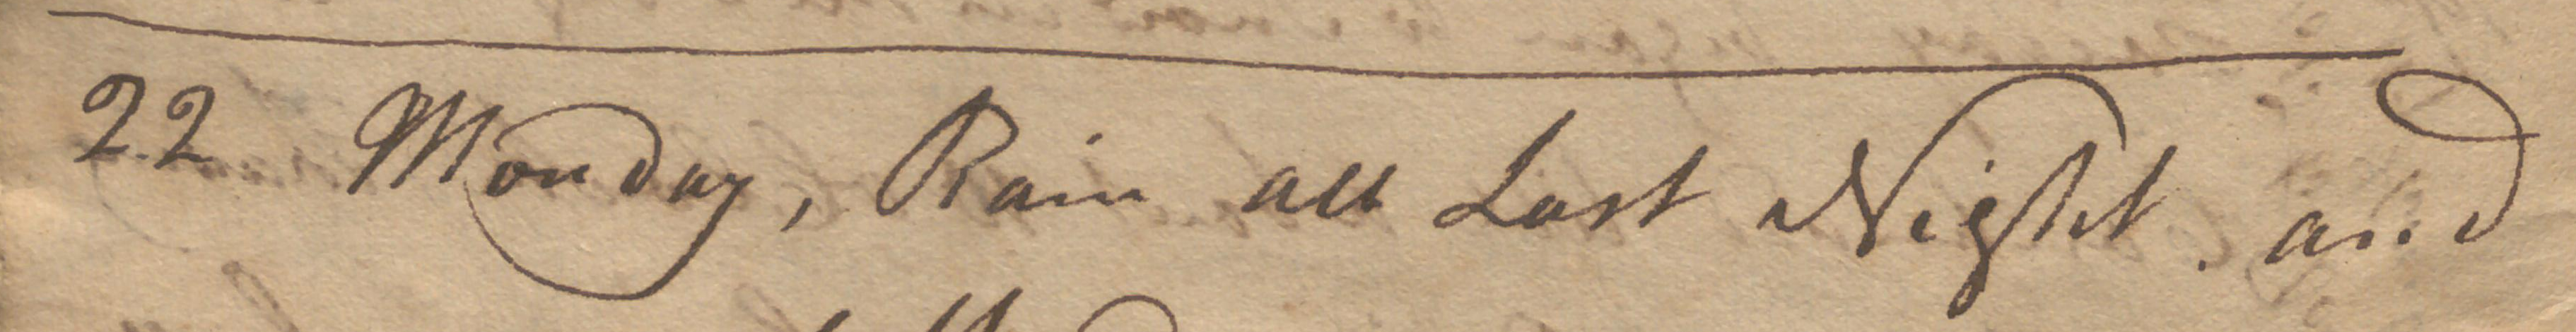22. Monday, Rain all Last Night and
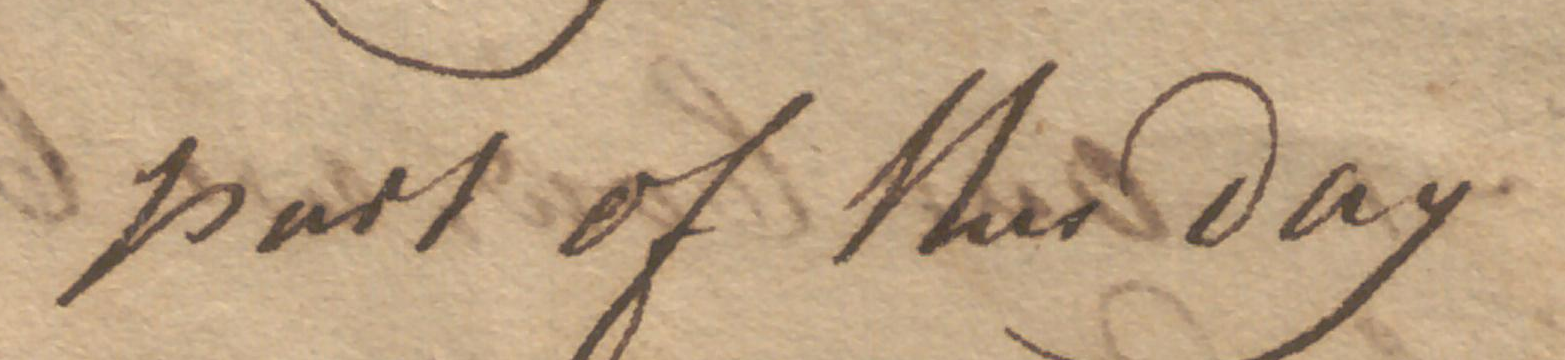part of this day
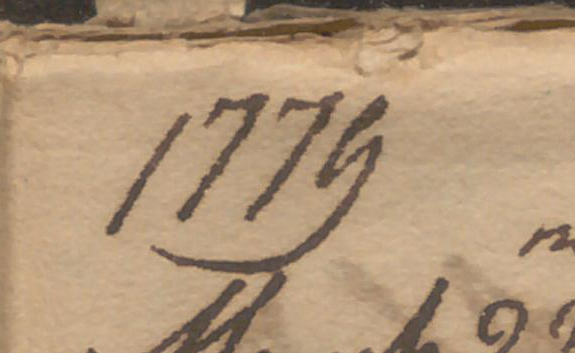1779
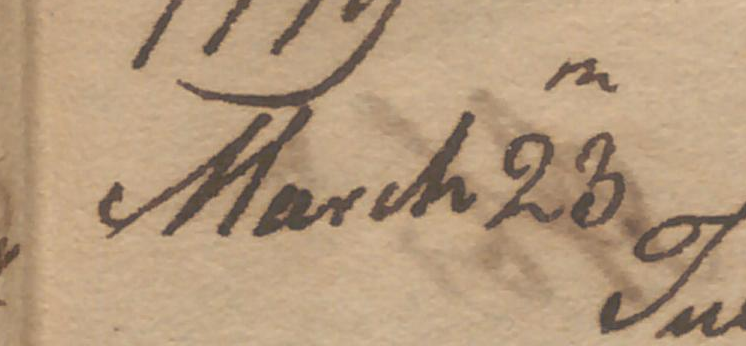March 23^th
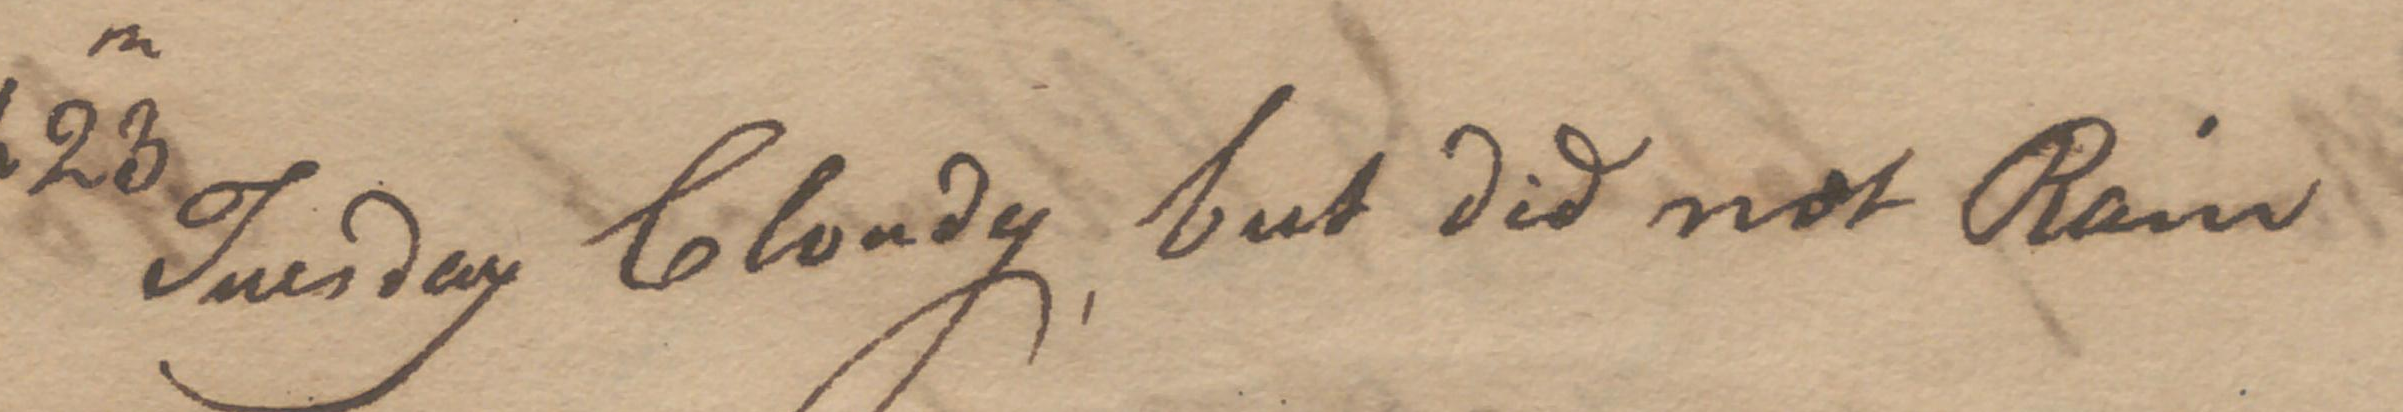Tuesday Cloudy but did not Rain
